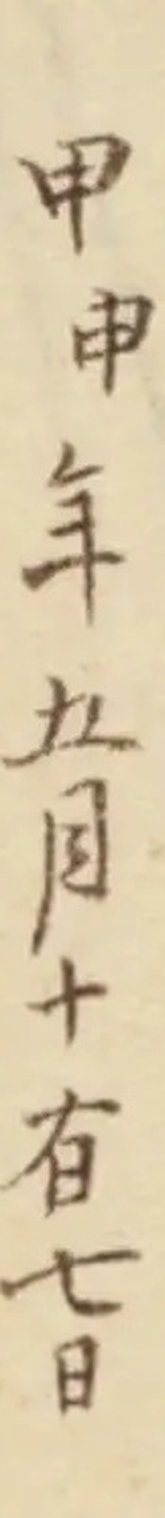甲申年五月十有七日

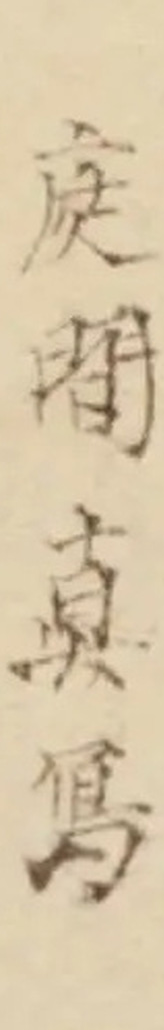庭間真寫

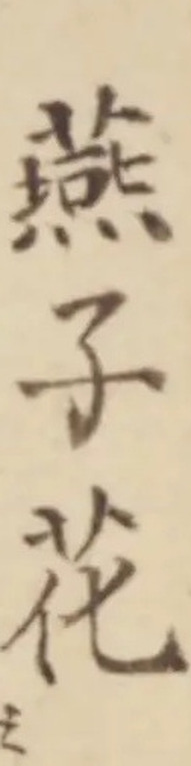燕子花
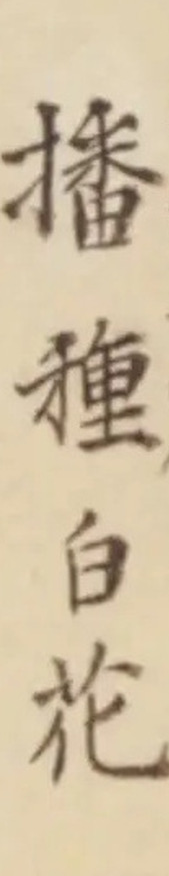播種白花
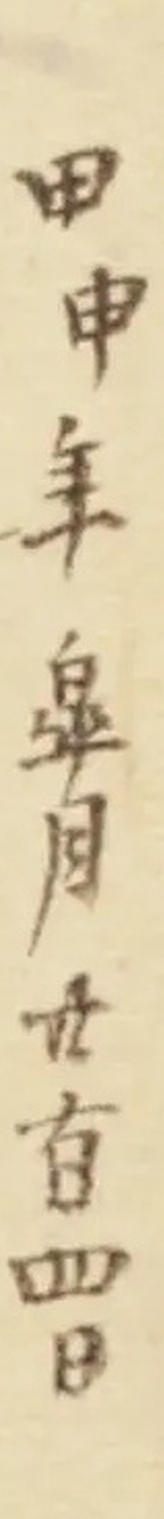甲申年皐月廿有四日
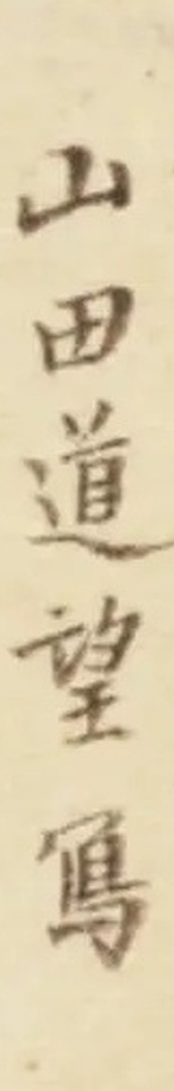山田道望寫

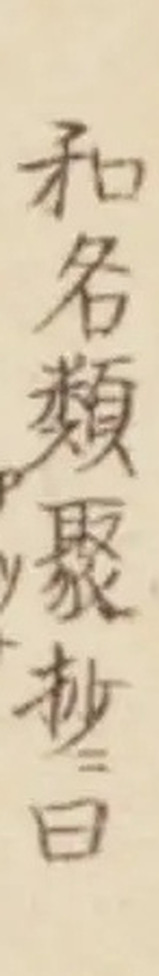和名類聚抄ニ曰
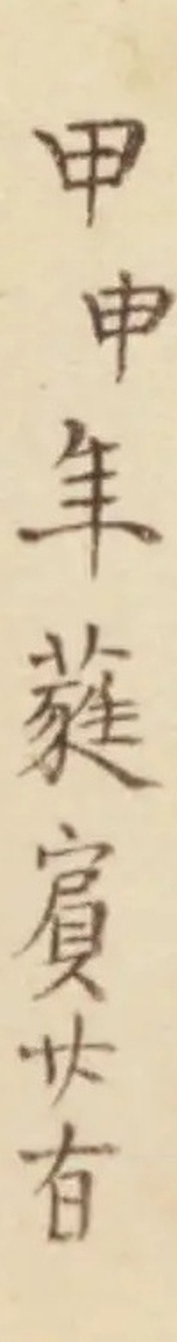甲申年蕤賓廿有
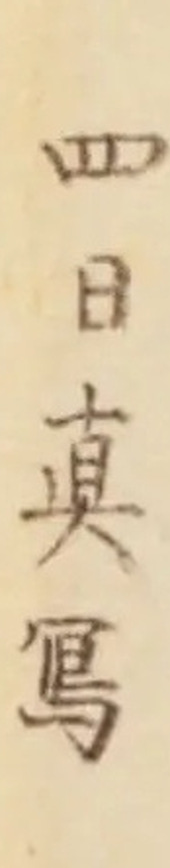四日真寫
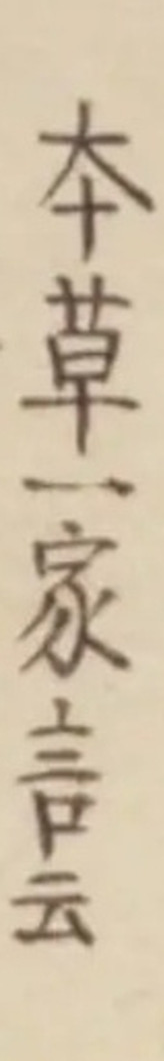本草一家言云

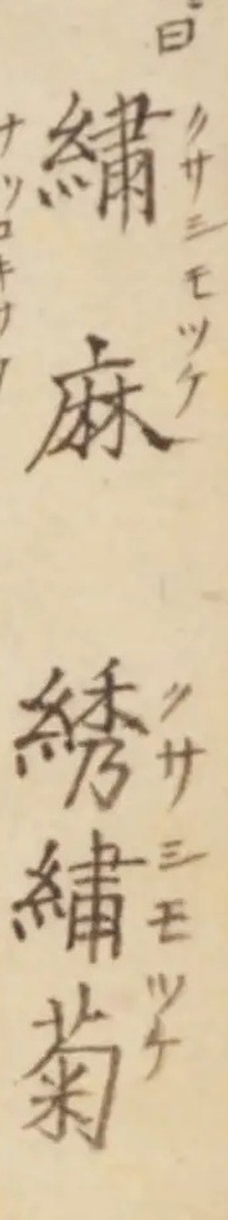繍麻綉繍菊
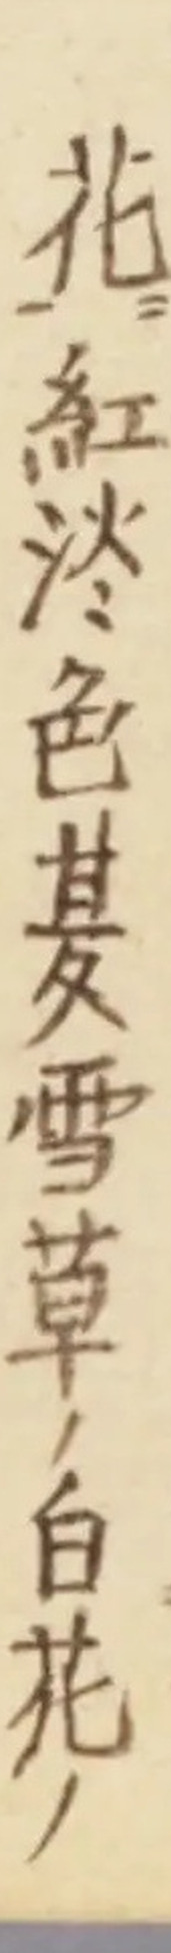花に紅淡色夏雪草の白花の
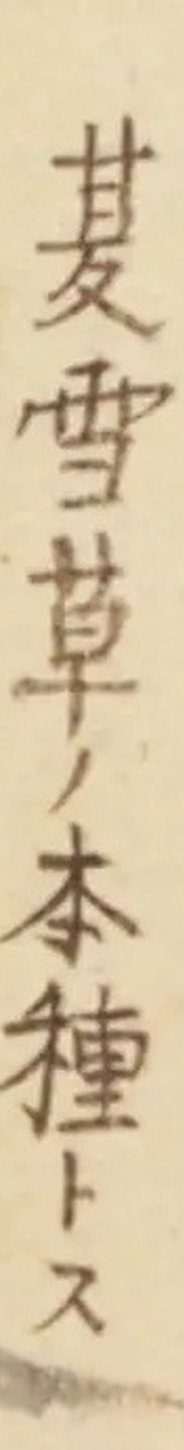夏雪草の本種とす
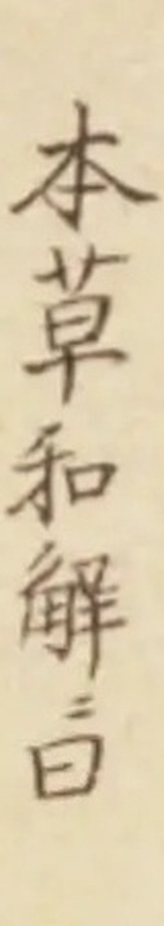本草和解に曰
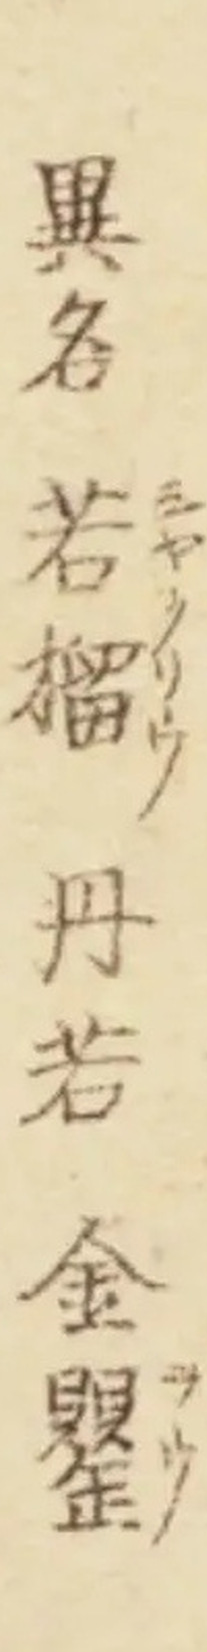石榴異名若榴丹若金罌
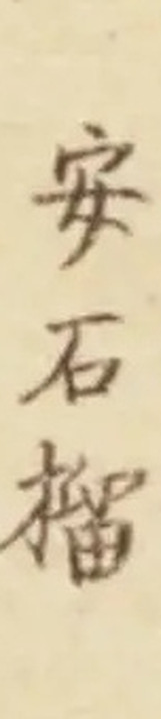安石榴
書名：梅園草木花譜夏之部. 2
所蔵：国立国会図書館 National Diet Library, JAPAN
